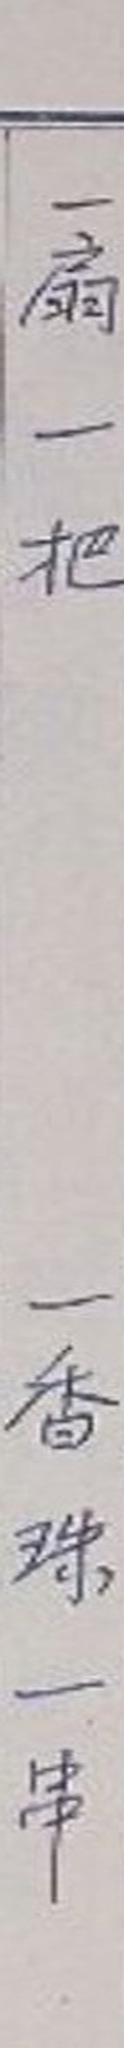一扇一把一香珠一串
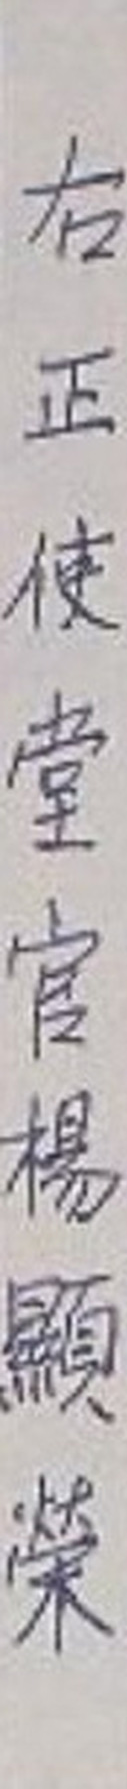右正使堂官楊顕栄
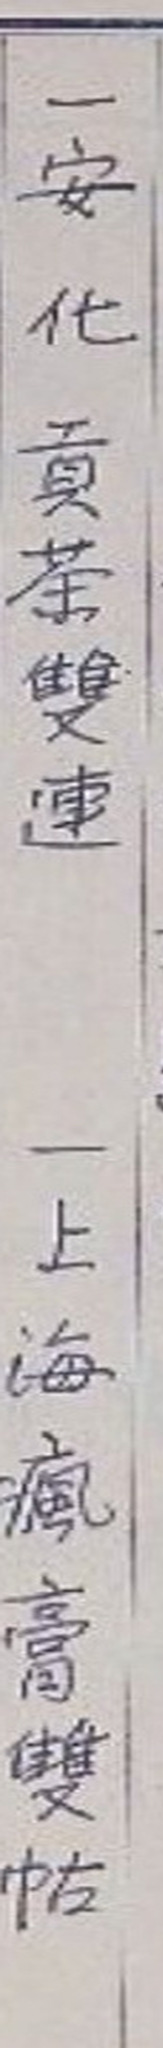一安化貢茶雙連一上海瘋膏雙帖
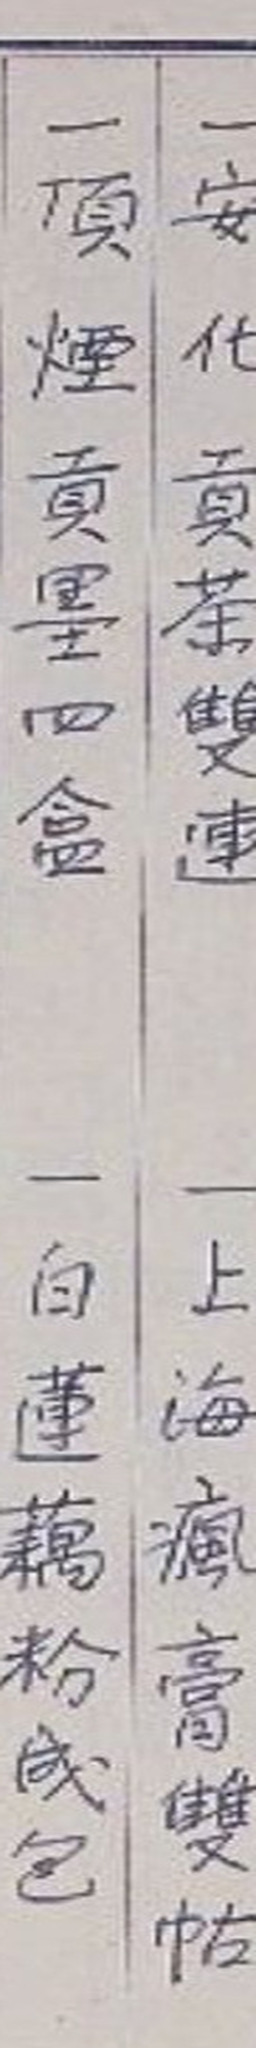一頂煙貢墨四盒一白蓮藕粉成包
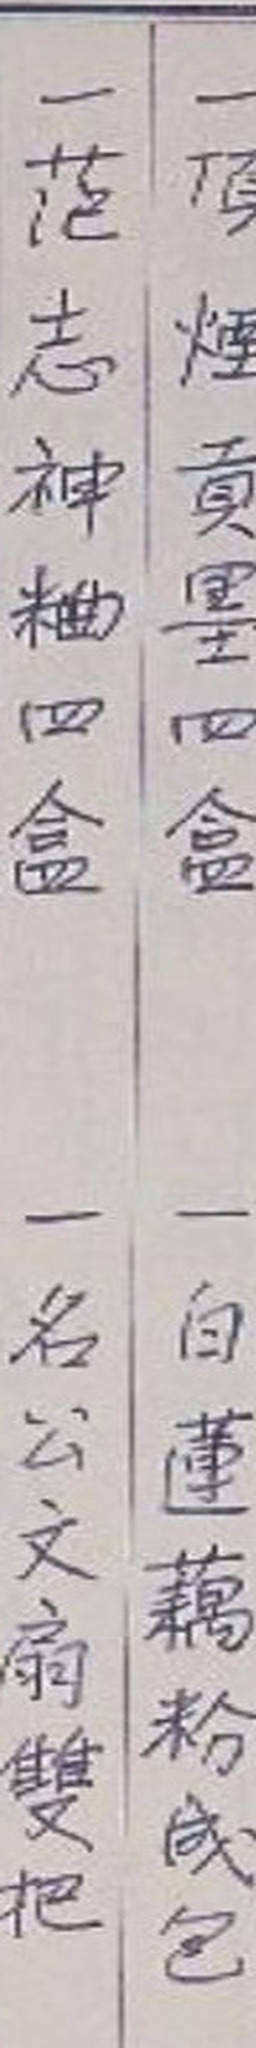一范志神粬四盒一名公文扇雙把
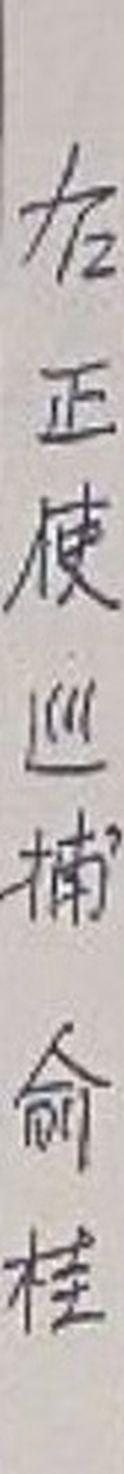右正使巡捕兪桂
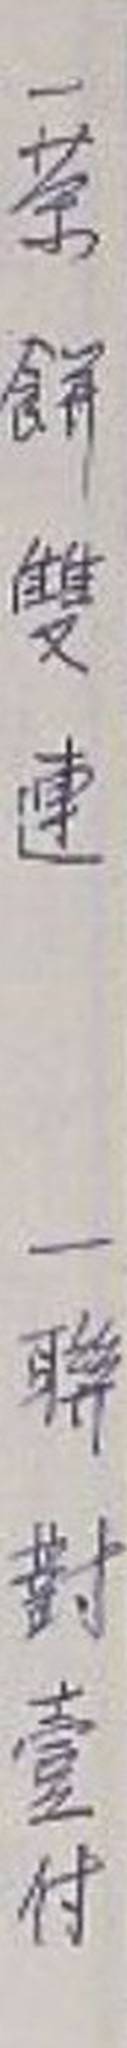一茶餅雙連一聯対壱付
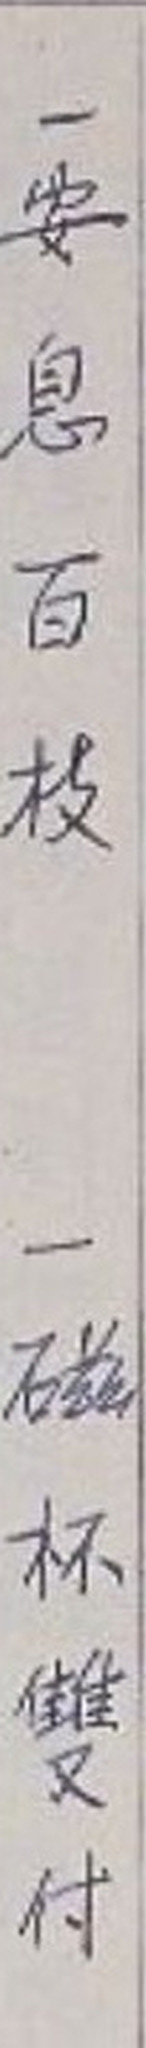一安息百枝一磁杯雙対
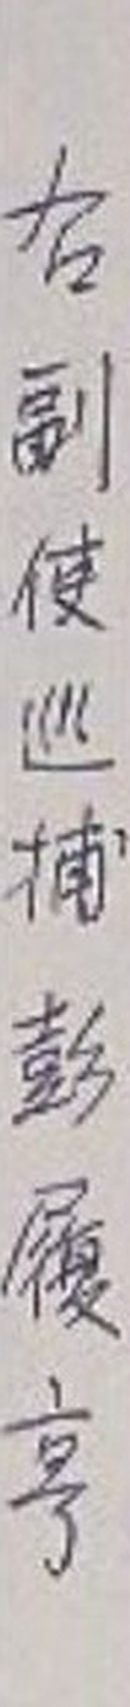右副使巡捕彭履亨
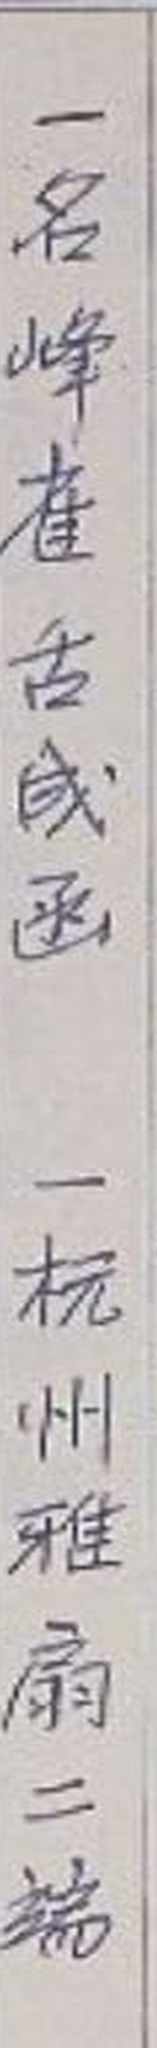一名峰雀舌成函一杭州雅扇二端
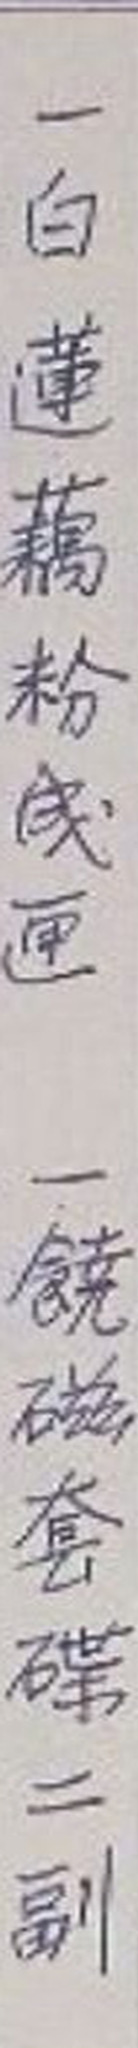一白蓮藕粉成匣一饒磁套碟二副
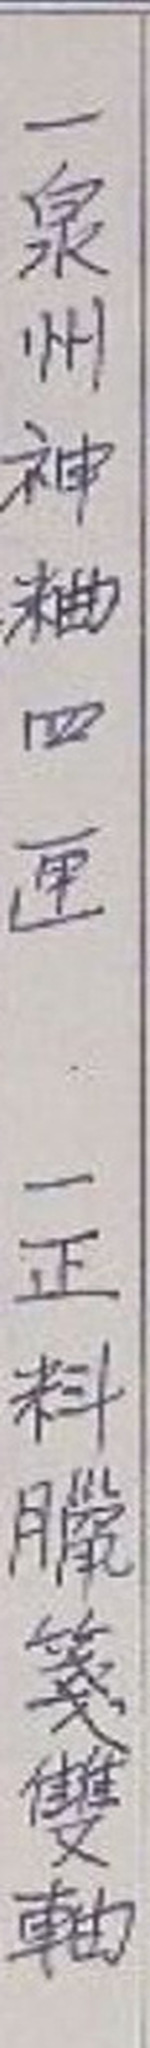一泉州神粬四匣一正料臘箋雙軸
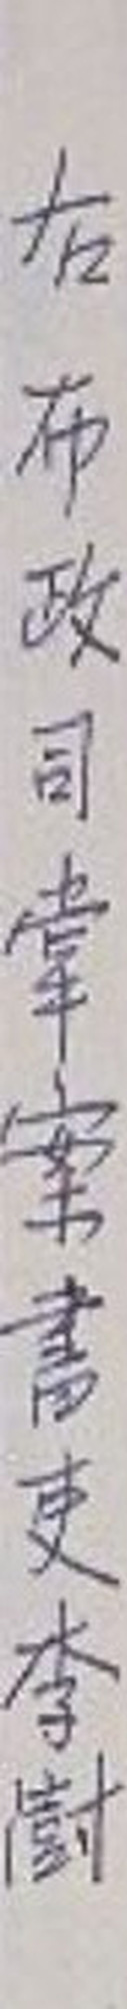右布政司掌案書吏李澍
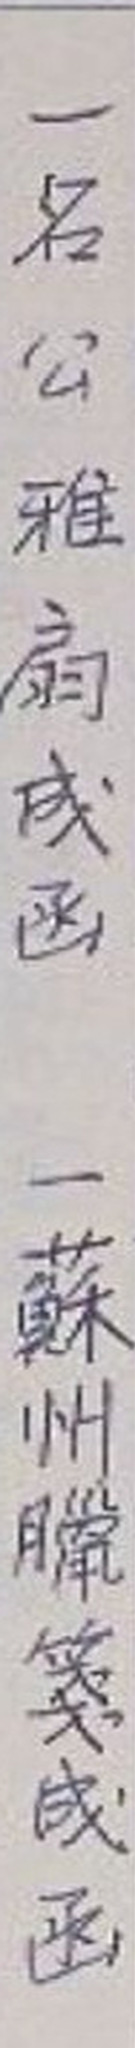一名公雅扇成函一蘇州臘箋成函
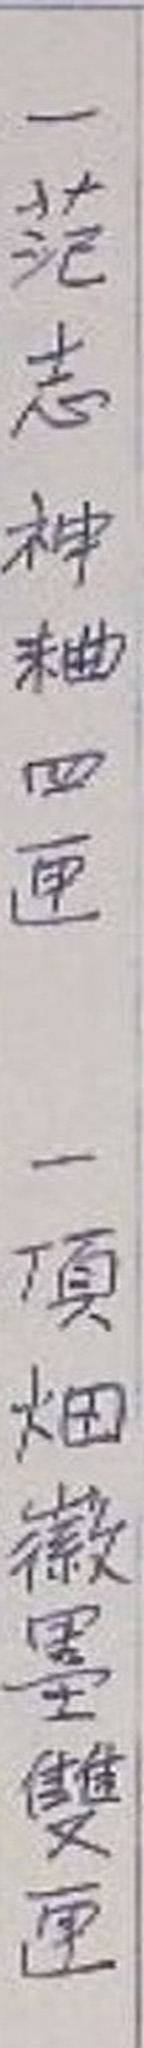一范志神粬四匣一頂烟徽墨雙匣
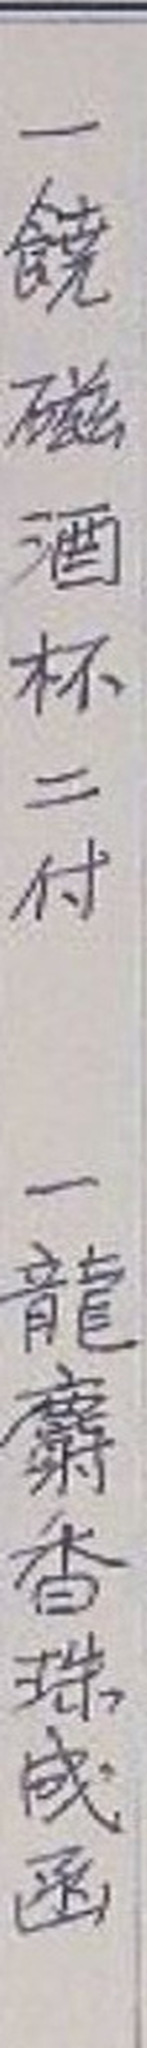一饒磁酒杯二付一龍麝香珠成函
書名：支那冊封使来琉諸記 下巻
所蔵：University of the Ryukyus Library
